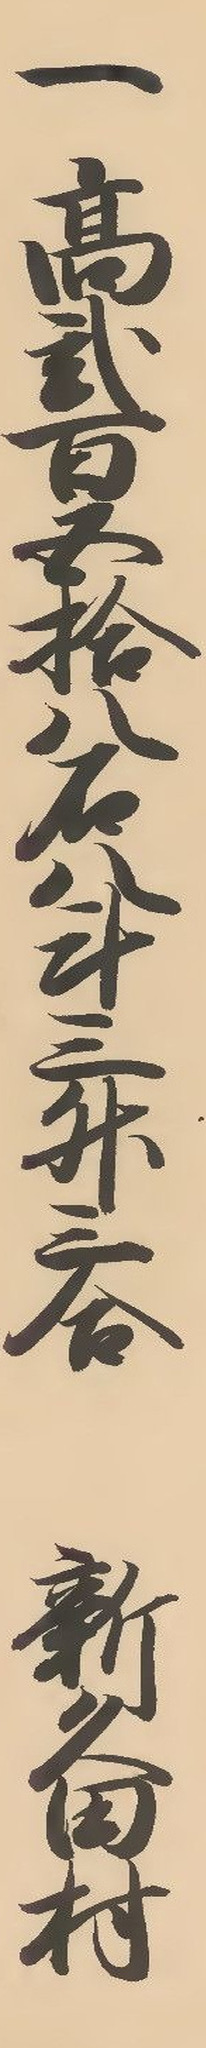一高弐百五拾八石八斗三升三合新久田村
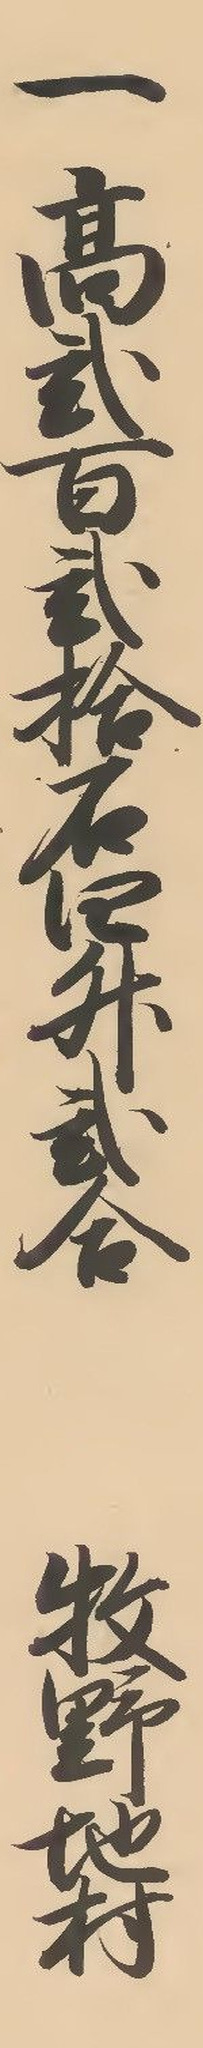一高弐百弐拾石四升弐合牧野地村

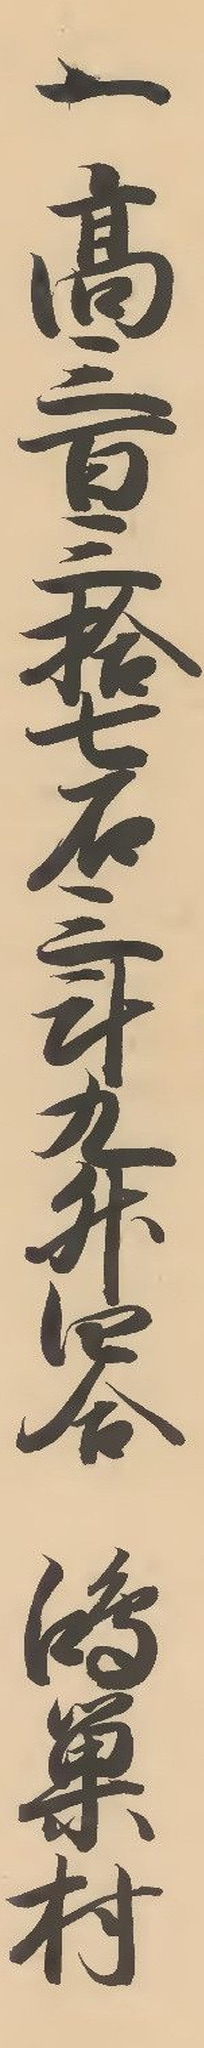一高三百三拾七石三斗九升四合鴻巣村
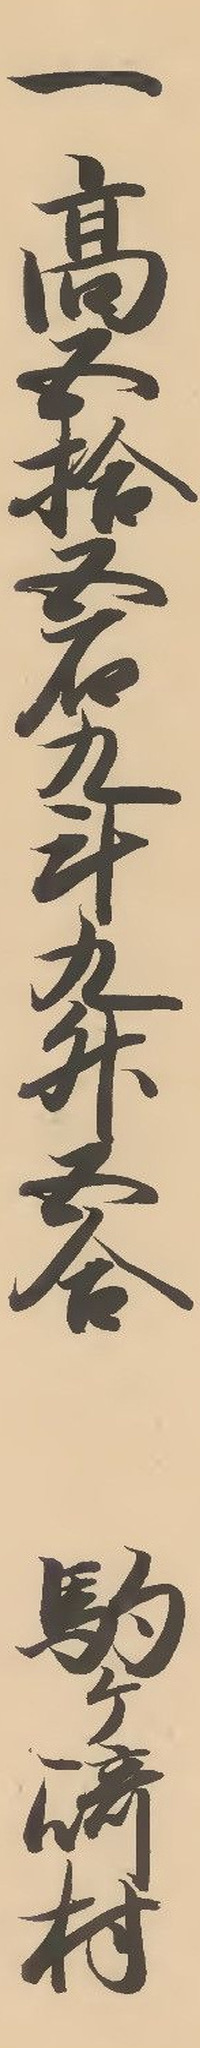一高五拾五石九斗九升五合駒ヶ崎村
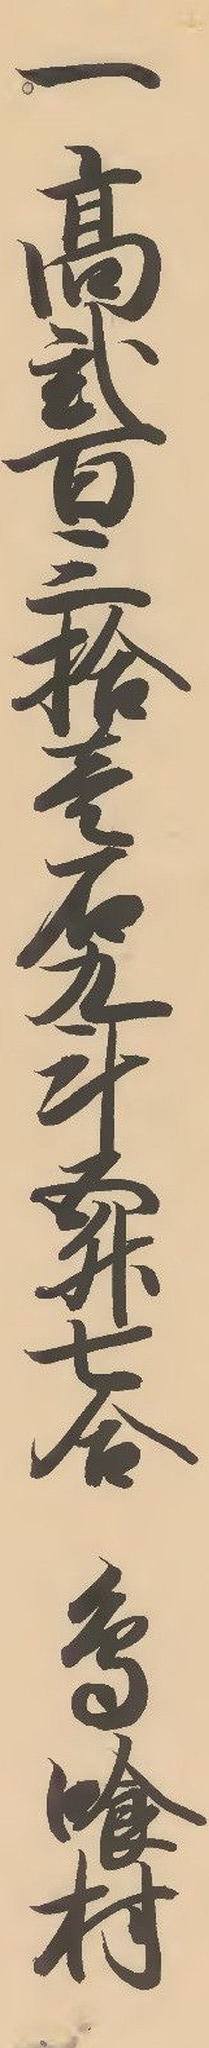一高弐百三拾壱石九斗五升七合鳥喰村
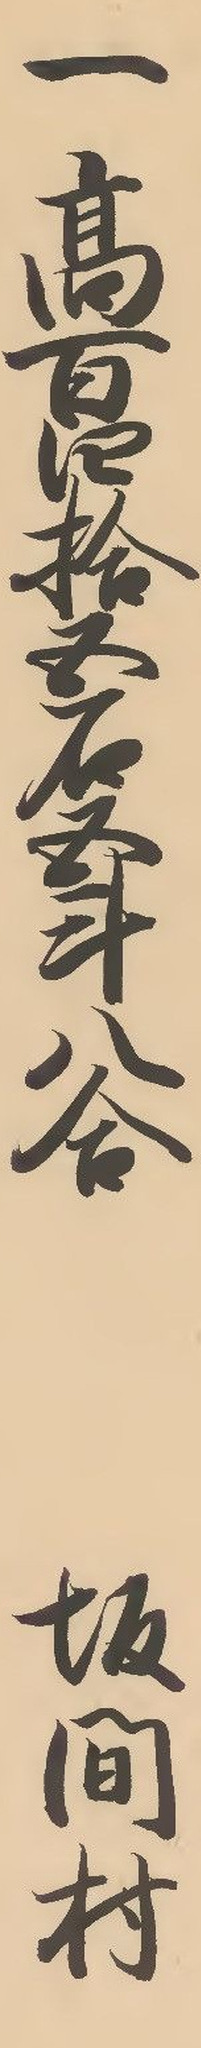一高百四拾五石五斗八合坂間村
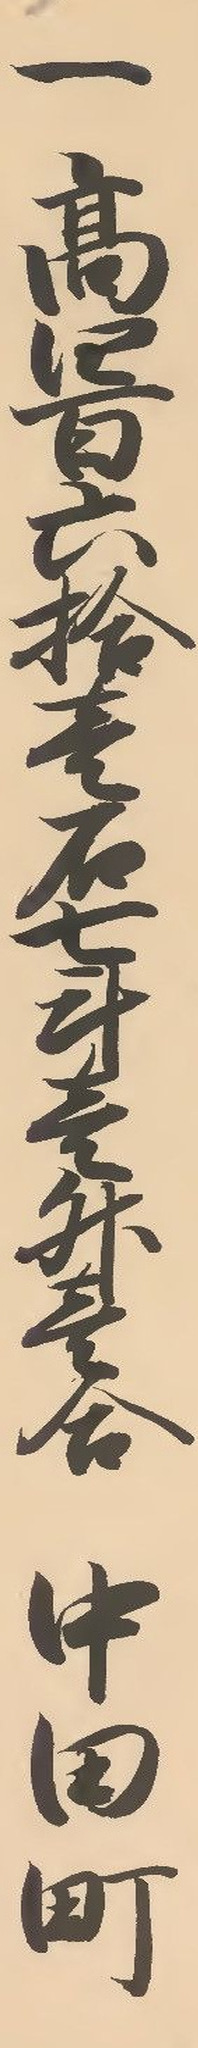一高四百六拾壱石七斗壱升壱合中田町
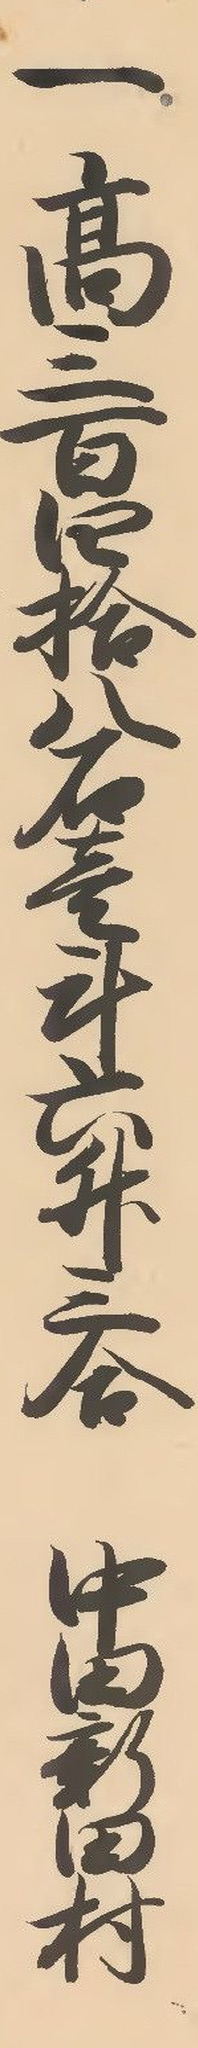一高三百四拾八石壱斗六升三合中田新田村
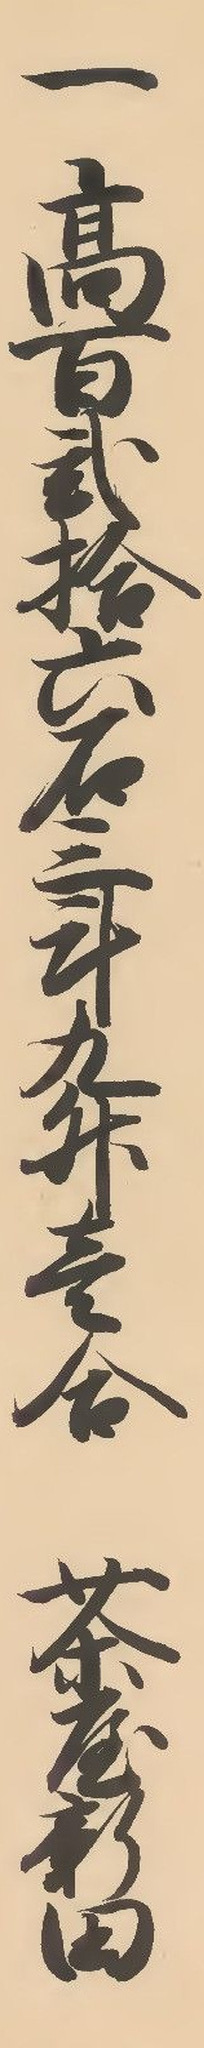一高百弐拾六石三斗九升壱合茶屋新田
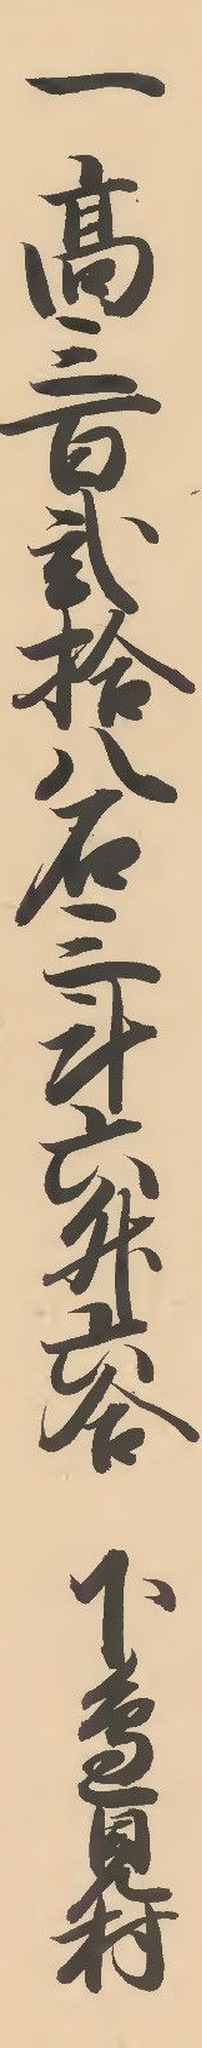一高三百弐拾八石三斗六升六合下辺見村

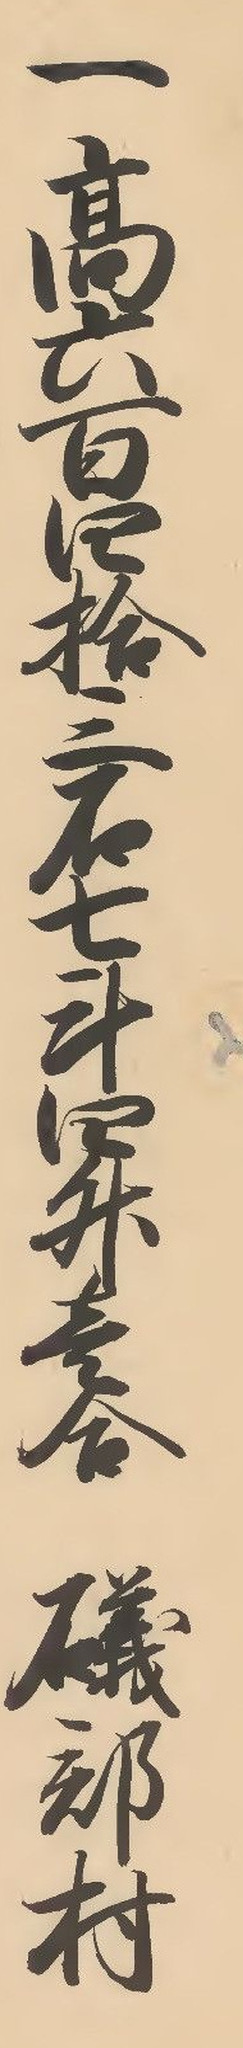一高六百四拾三石七斗四升壱合磯部村
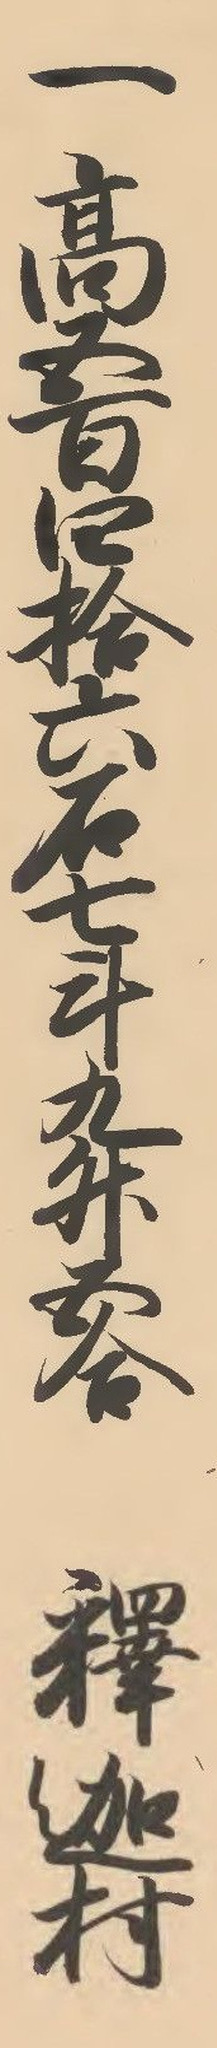一高五百四拾六石七斗九升五合釈迦村
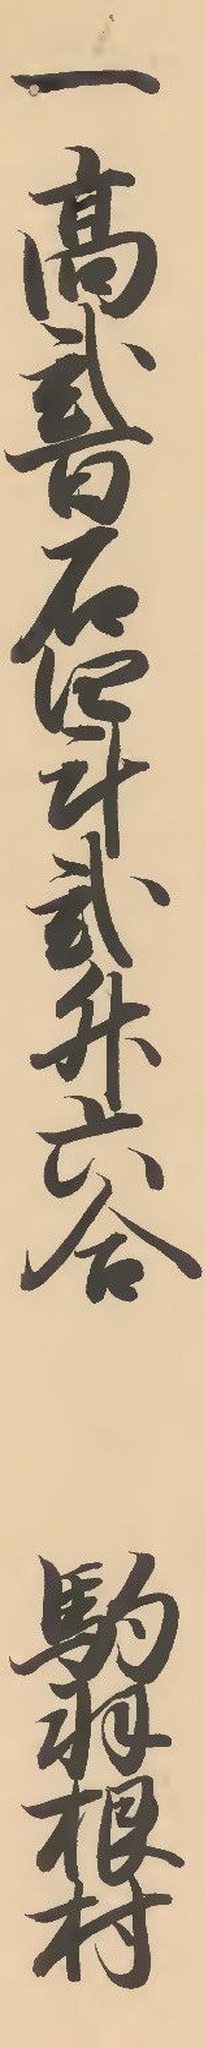一高弐百石四斗弐升六合駒羽根村
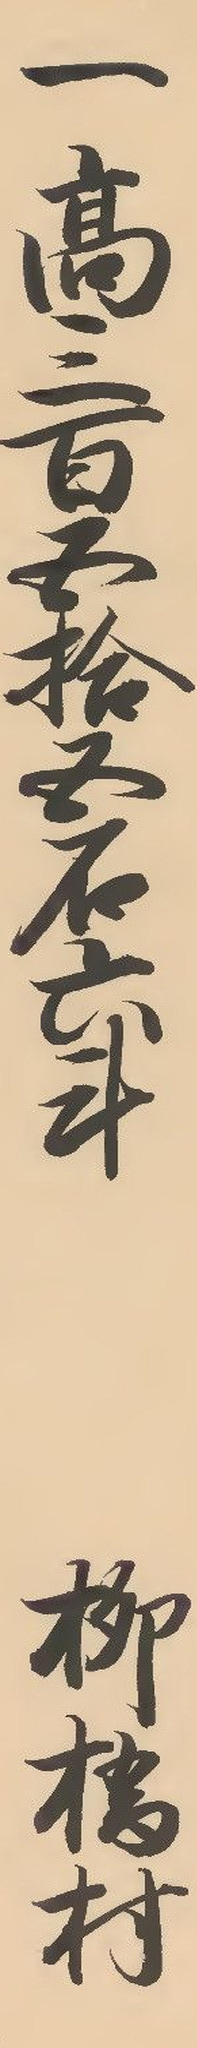一高三百五拾五石六斗柳橋村
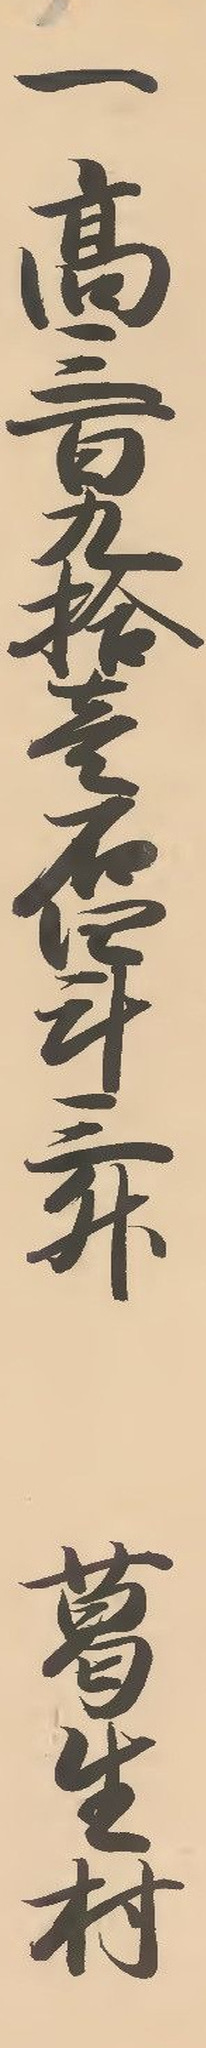一高三百九拾壱石四斗三升葛生村
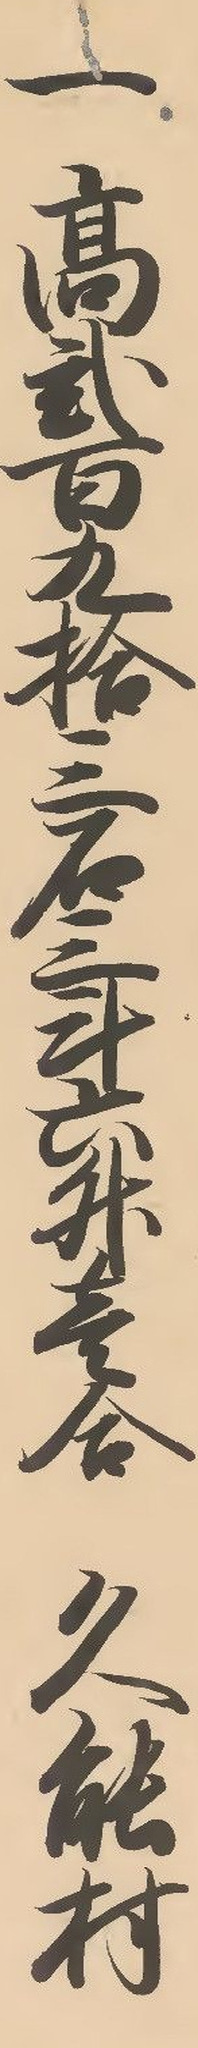一高弐百九拾三石三斗六升壱合久能村
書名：下総国郷帳
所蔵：国立公文書館 National Archives of Japan
